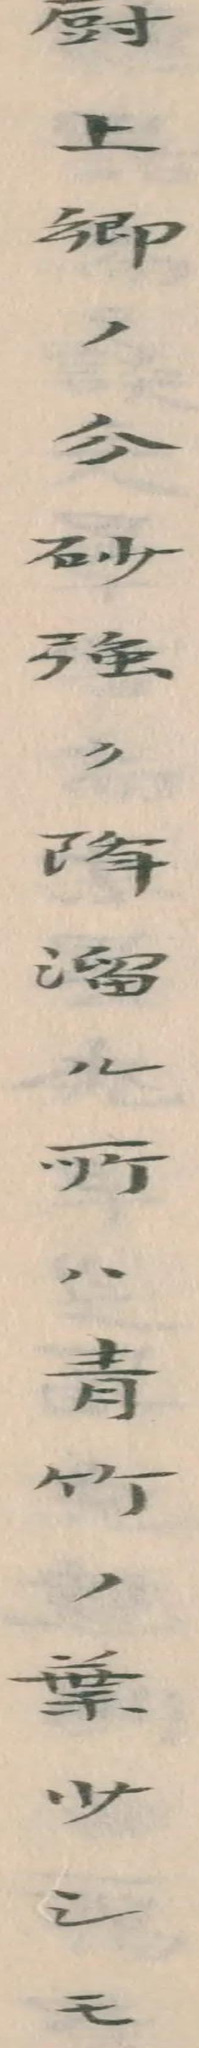厨上郷ノ分砂強ク降溜ル所ハ青竹ノ葉少シモ
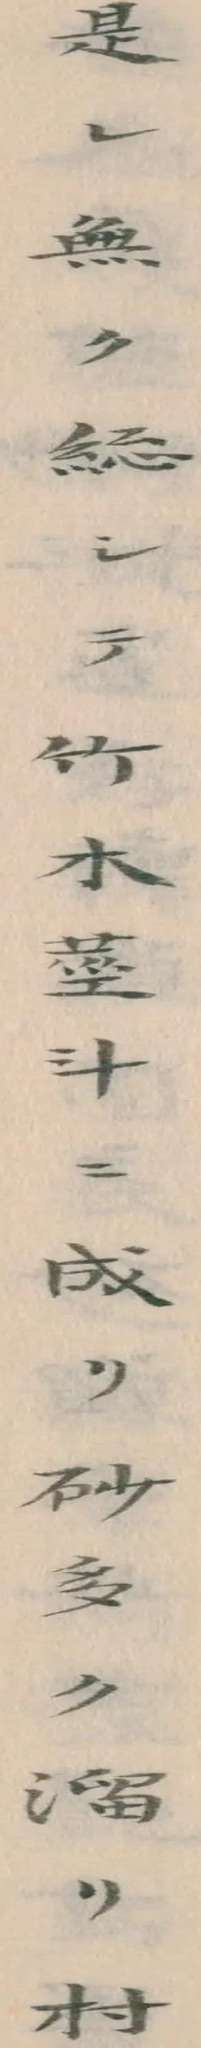是レ無ク総シテ竹木莖斗ニ成リ砂多ク溜リ村
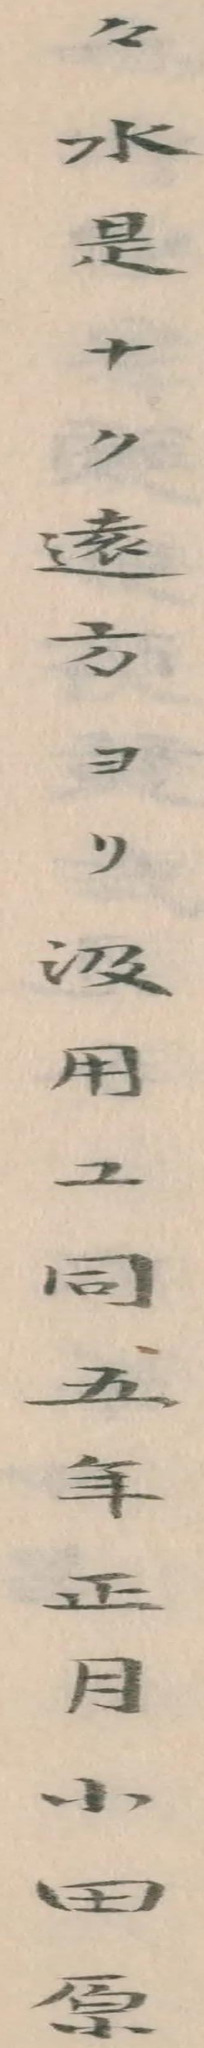々水是ナク遠方ヨリ汲用ユ同五年正月小田原
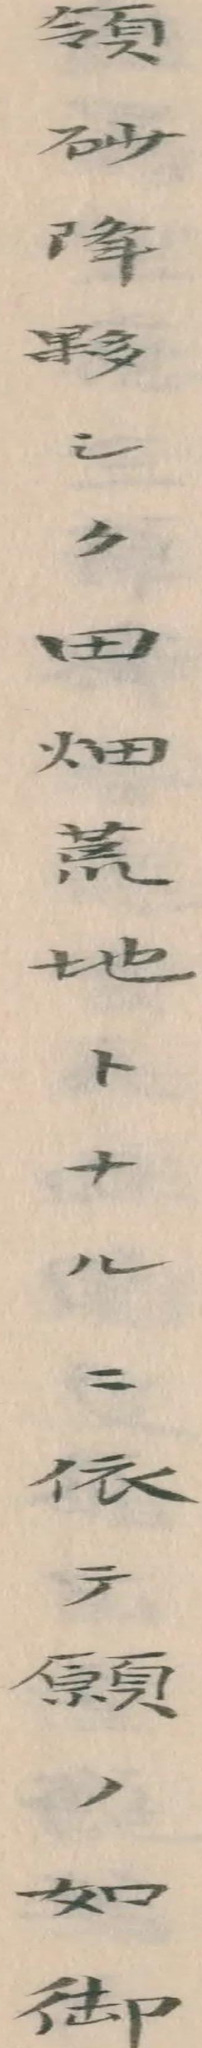領砂降夥シク田畑荒地トナルニ依テ願ノ如御
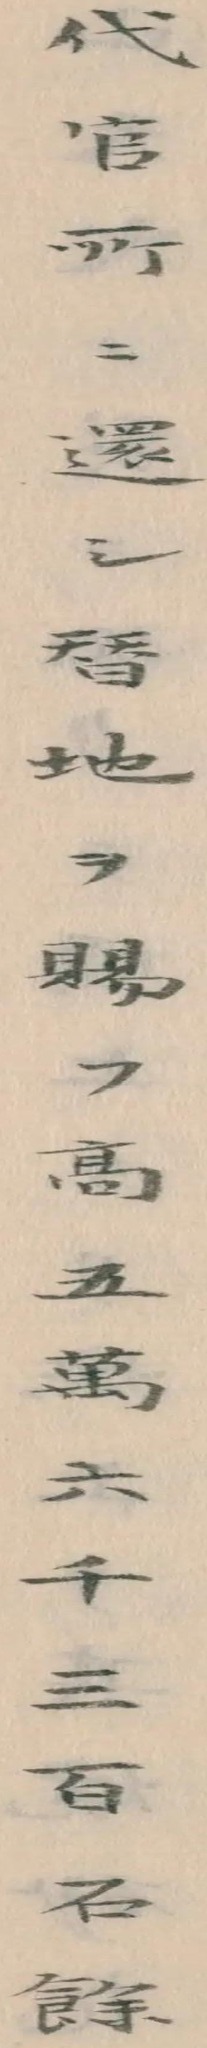代官所ニ還シ替地ヲ賜フ高五萬六千三百石餘
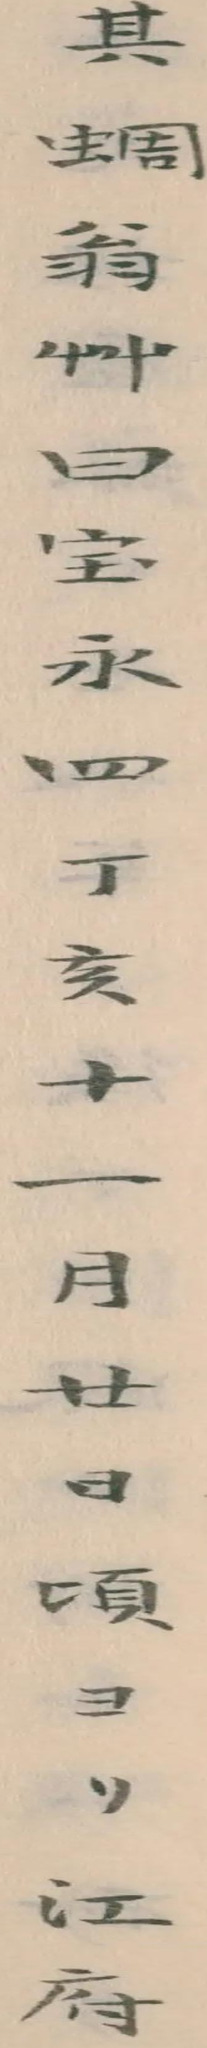其蜩翁艸曰宝永四丁亥十一月廿日頃ヨリ江府
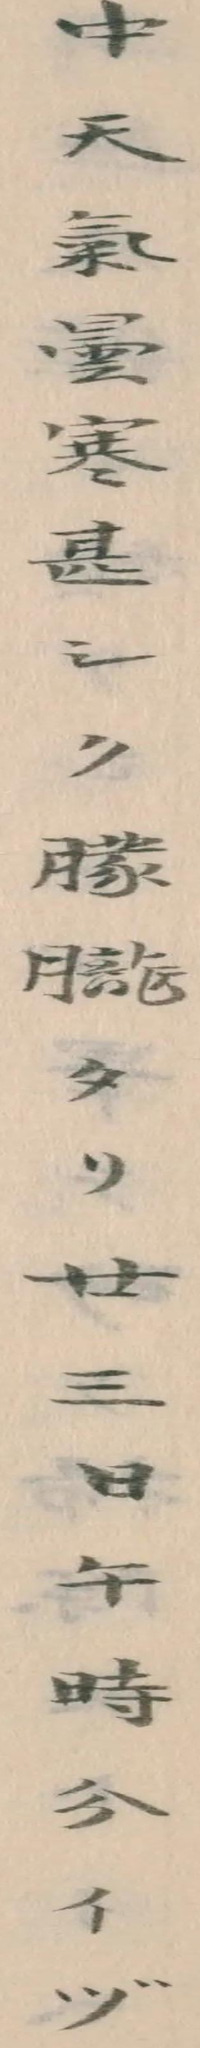中天氣曇寒甚シク朦朧タリ廿三日午時分イヅ
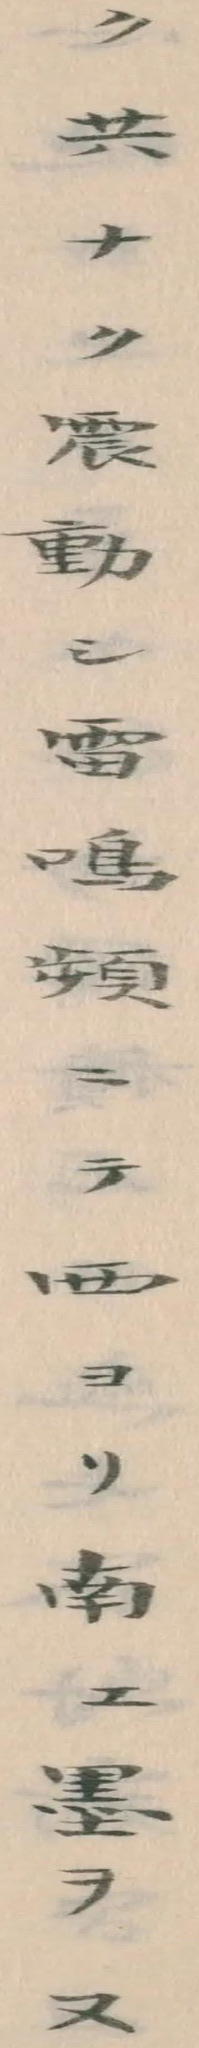ク共ナク震動シ雷鳴頻ニテ西ヨリ南エ墨ヲヌ
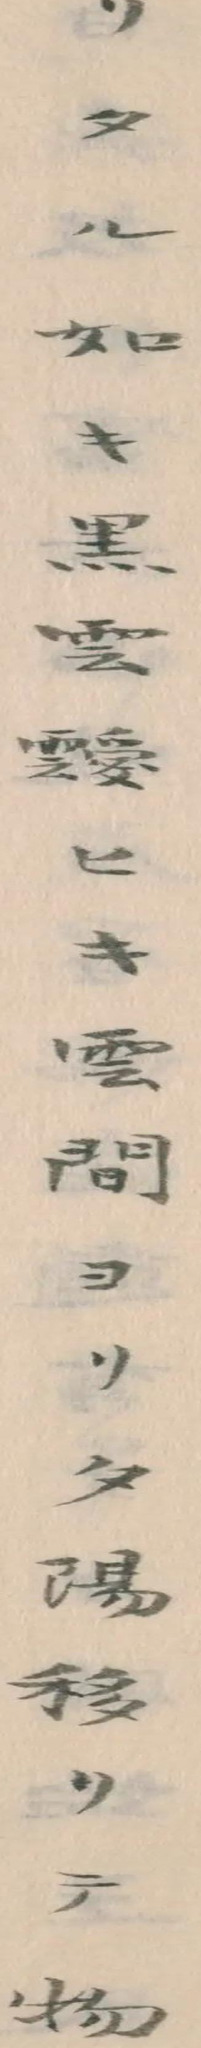リタル如キ黒雲靉ヒキ雲間ヨリ夕陽移リテ物
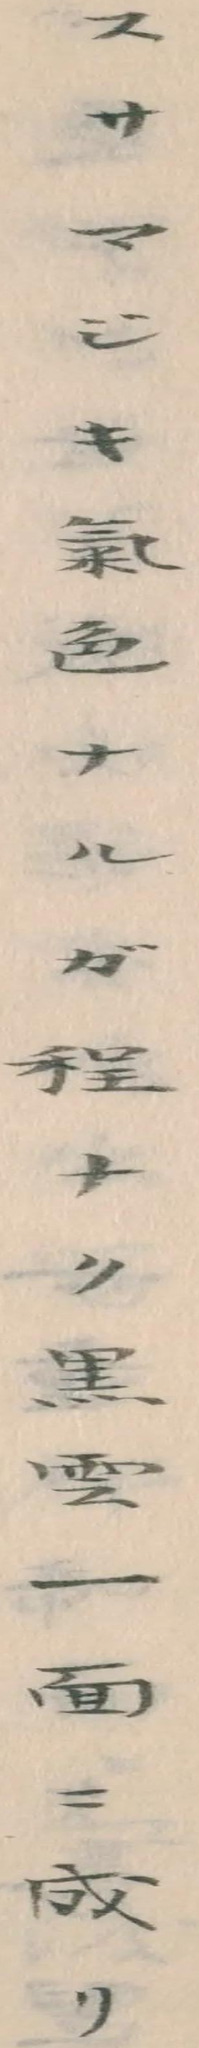スサマジキ氣色ナルガ程ナク黒雲一面ニ成リ
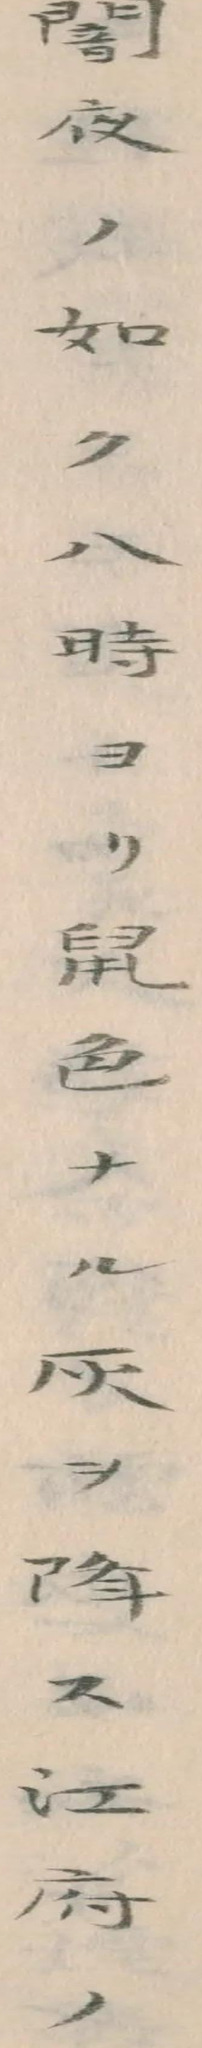闇夜ノ如ク八時ヨリ鼠色ナル灰ヲ降ス江府ノ
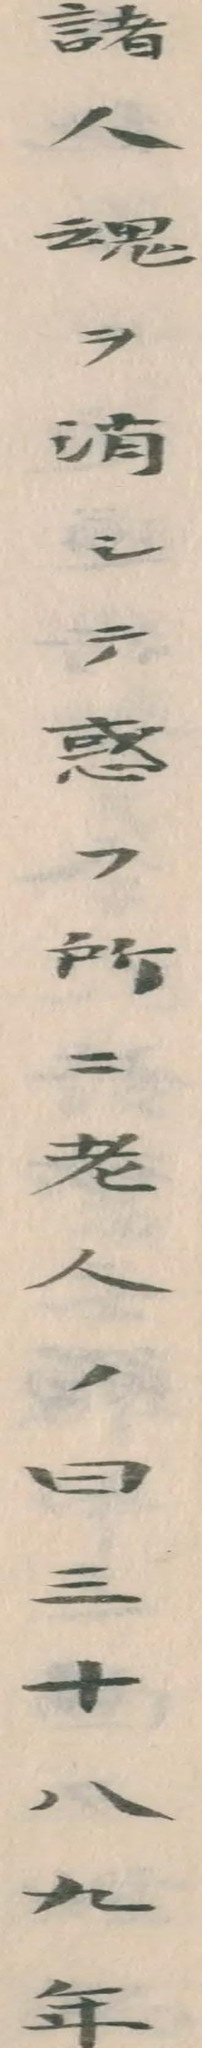諸人魂ヲ消シテ惑フ所ニ老人ノ曰三十八九年
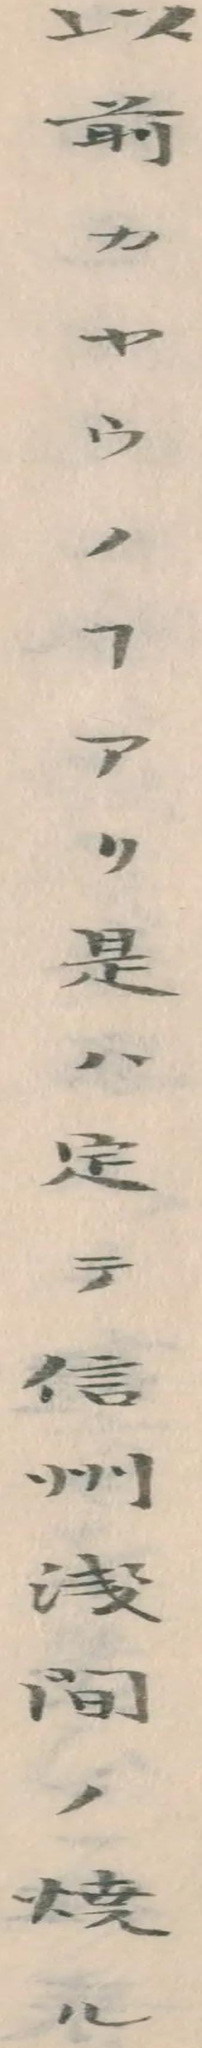以前カヤウノコトアリ是ハ定テ信州浅間ノ焼ル
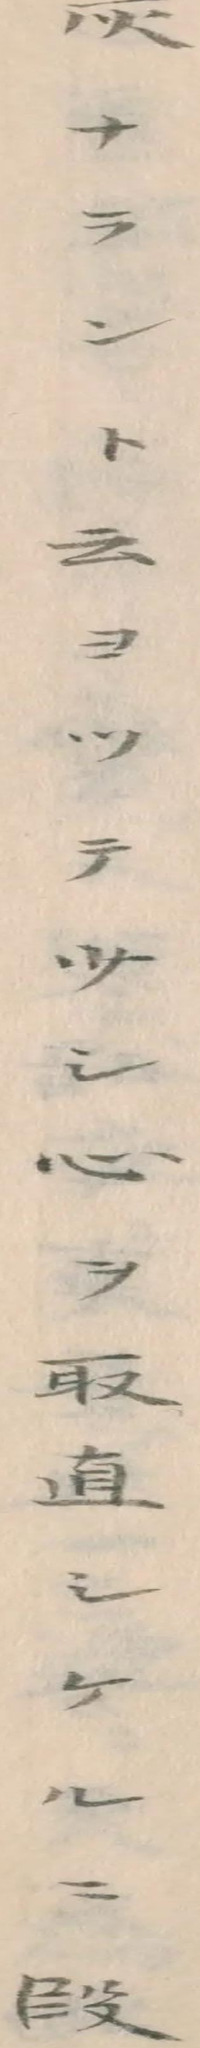灰ナラント云ヨツテ少シ心ヲ取直シケルニ段
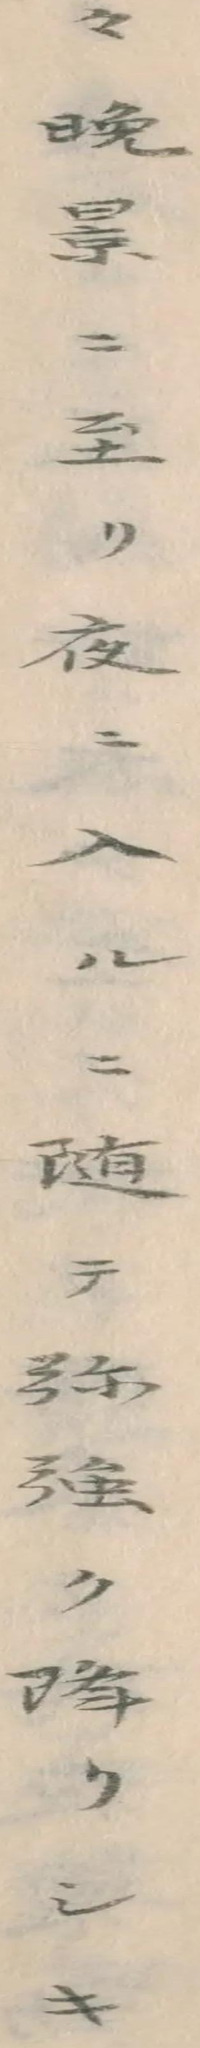々晩景ニ至リ夜ニ入ルニ随テ弥強ク降リシキ

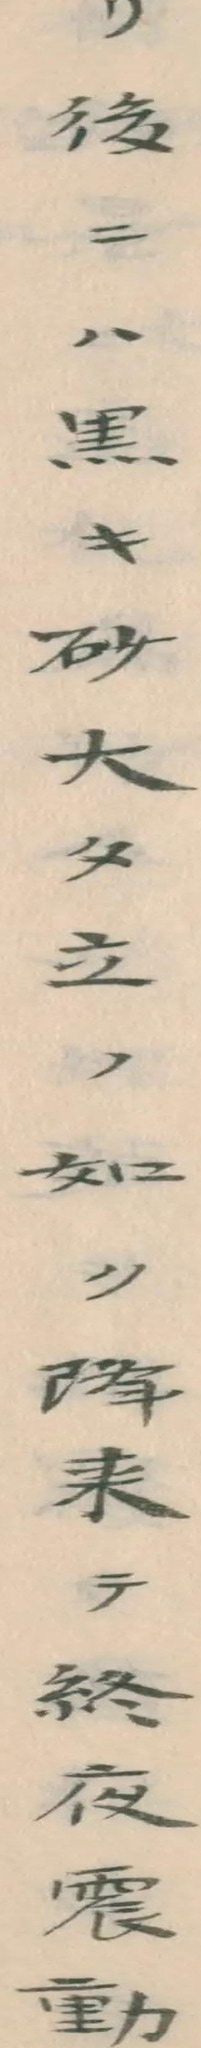リ後ニハ黒キ砂大夕立ノ如ク降来テ終夜震動
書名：地災撮要. 巻11-12(地震之部)
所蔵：国立国会図書館 National Diet Library, JAPAN
